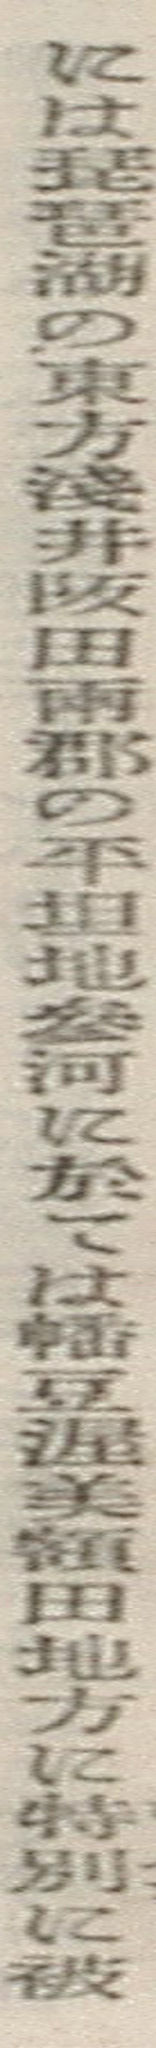には琵琶湖の東方浅井阪田両郡の平坦地参河に於ては幡豆渥美額田地方に特別に被
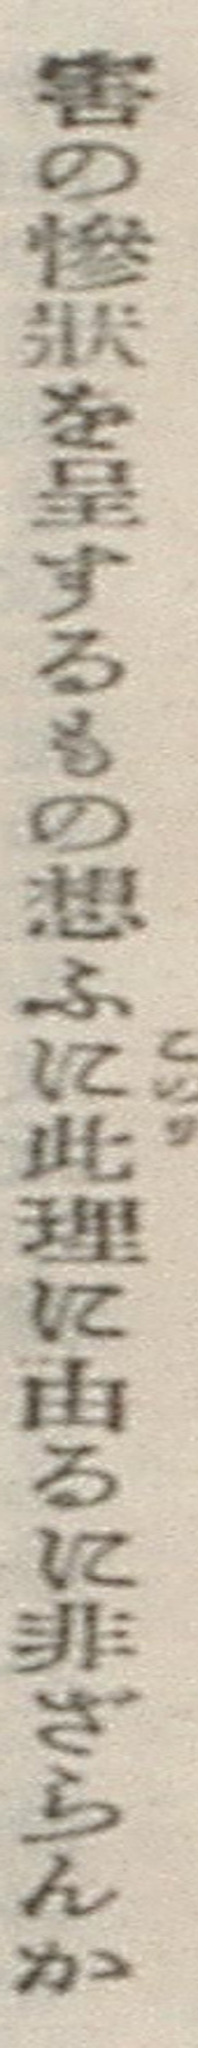害の惨状を呈するもの想ふに此理に由るに非ざらんか
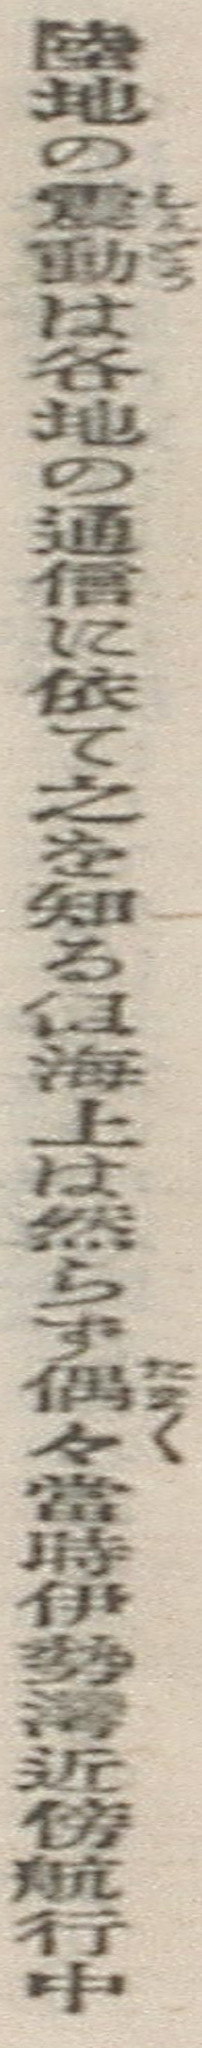陸地の震動は各地の通信に依て之を知る但海上は然らず偶々当時伊勢湾近傍航行中
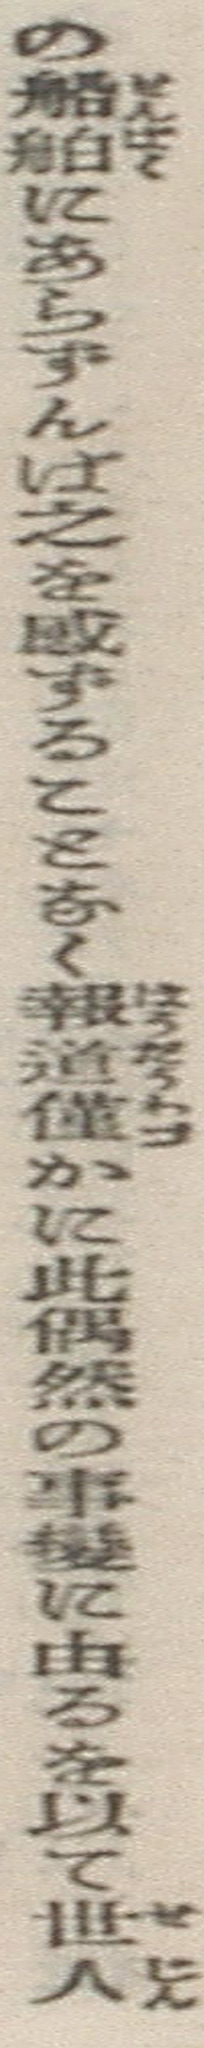の船舶にあらずんば之を感ずることなく報道僅かに此偶然の事変に由るを以て世人
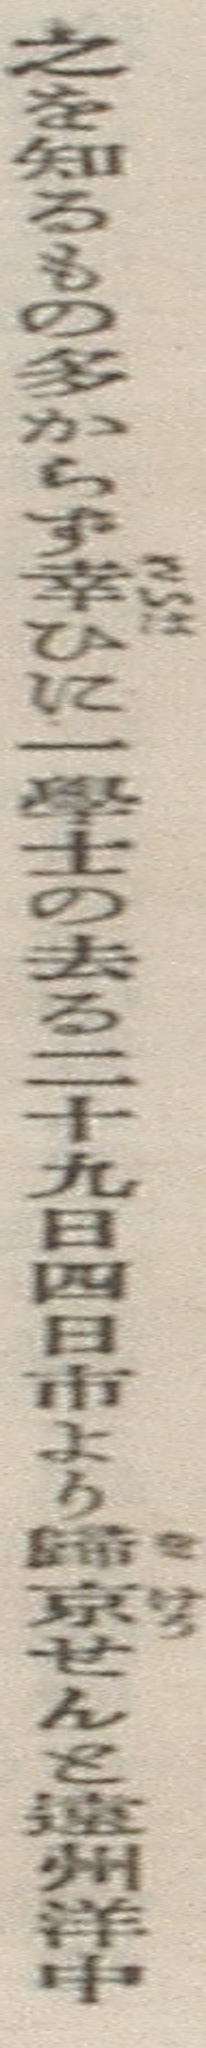之を知るもの多からず幸ひに一学士の去る二十九日四日市より帰京せんと遠州洋中
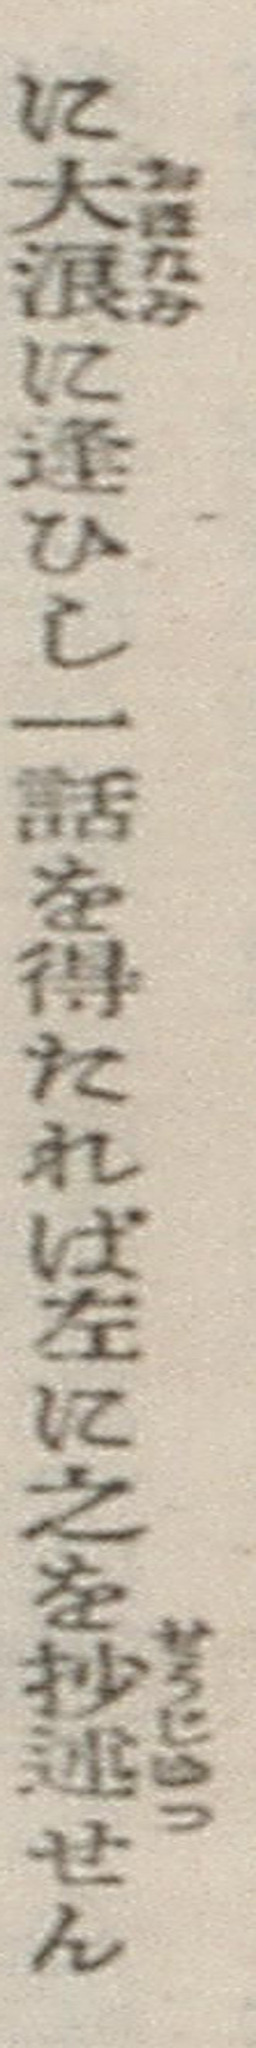に大浪に逢ひし一話を得たれば左に之を抄述せん
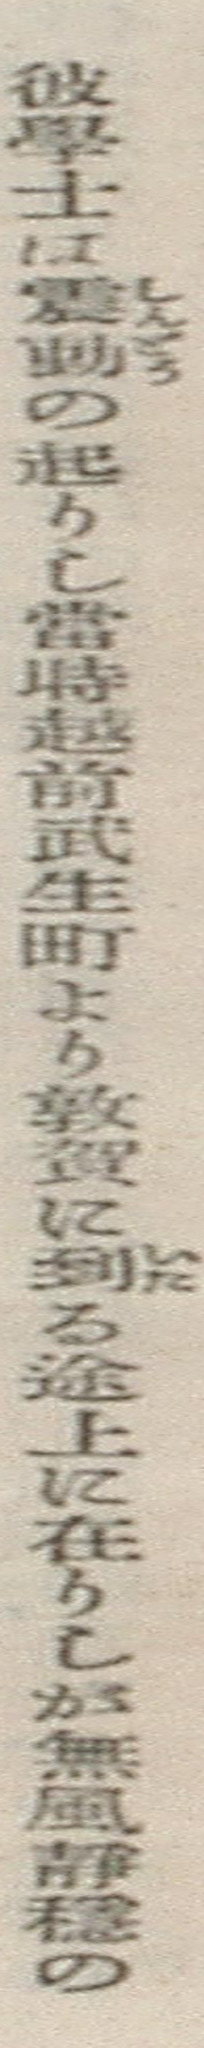彼学士は震動の起こりし当時越前武生町より敦賀に到る途上に在りしが無風静穏の
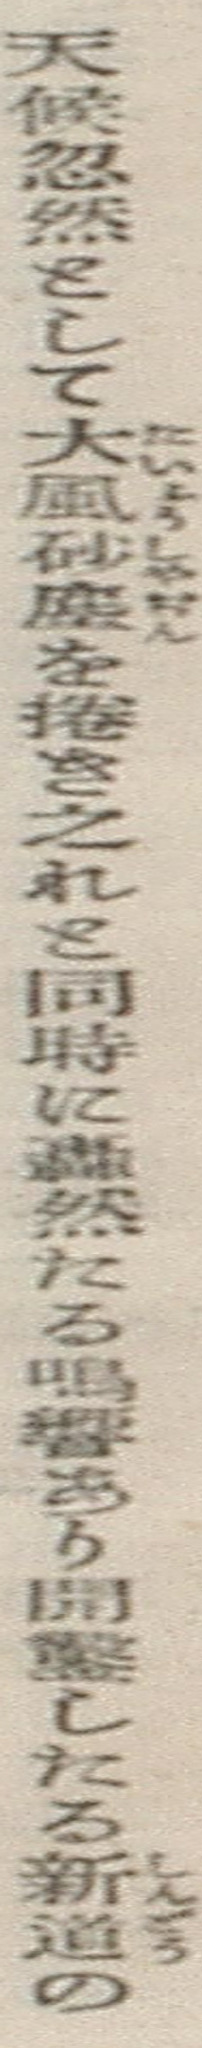天候忽然として大風砂塵を捲き之れと同時に轟然たる鳴響あり開鑿したる新道の
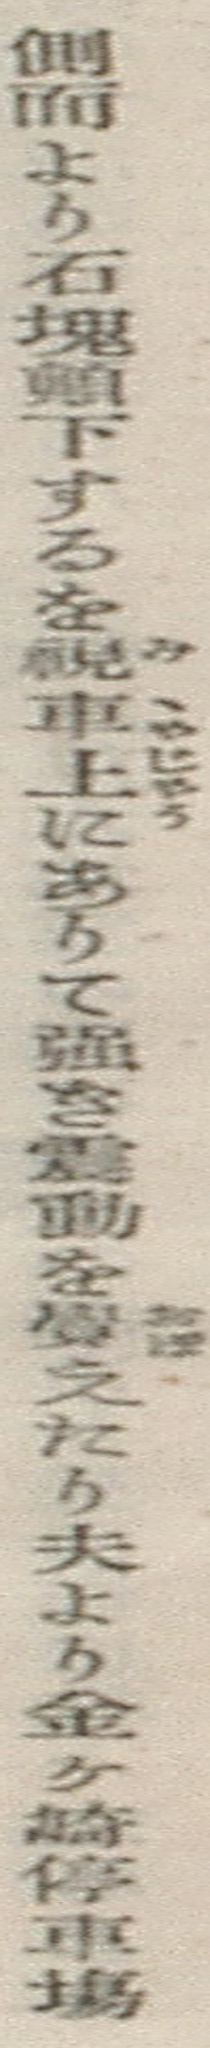側面より石塊顛下するを視車上にありて強き震動を覚えたり夫より金ケ崎停車場
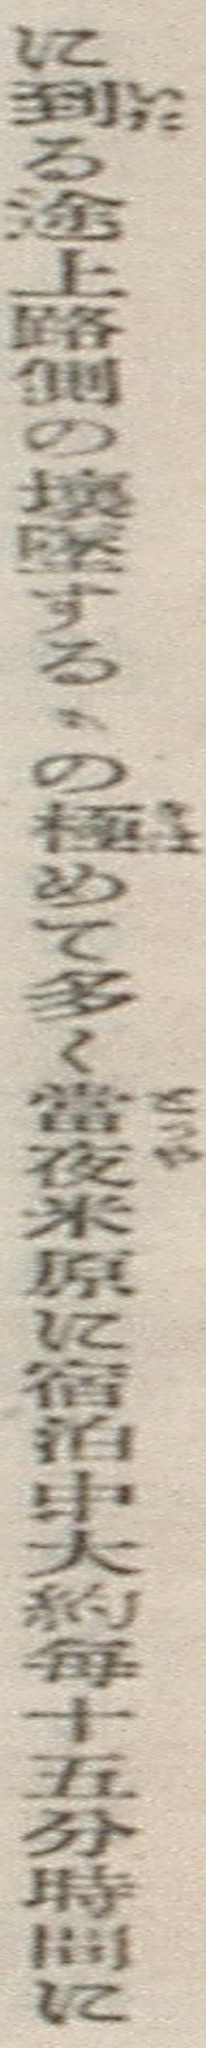に到る途上路側の壊墜するもの極めて多く当夜米原に宿泊中大約毎十五分時間に
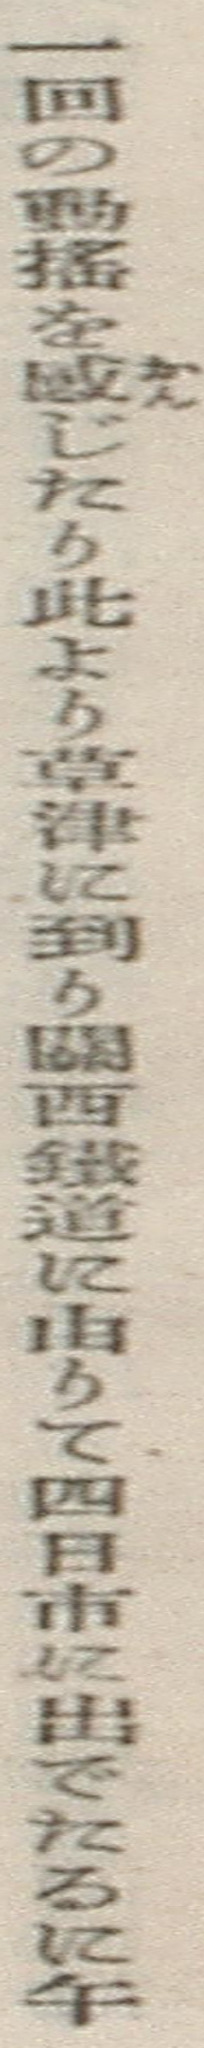一回の動揺を感じたり此より草津に到り関西鉄道に由りて四日市に出でたるに午
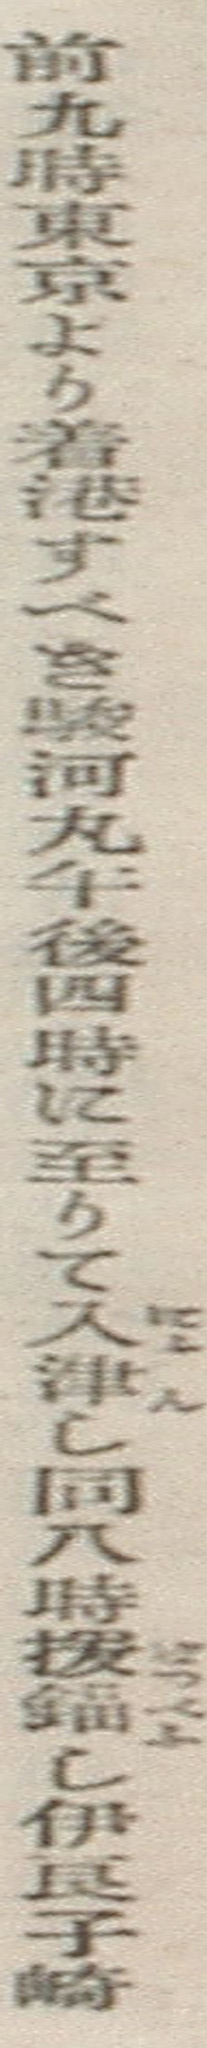前九時東京より着港すべき駿河丸午後四時に到りて入津し同八時拔錨し伊良子崎
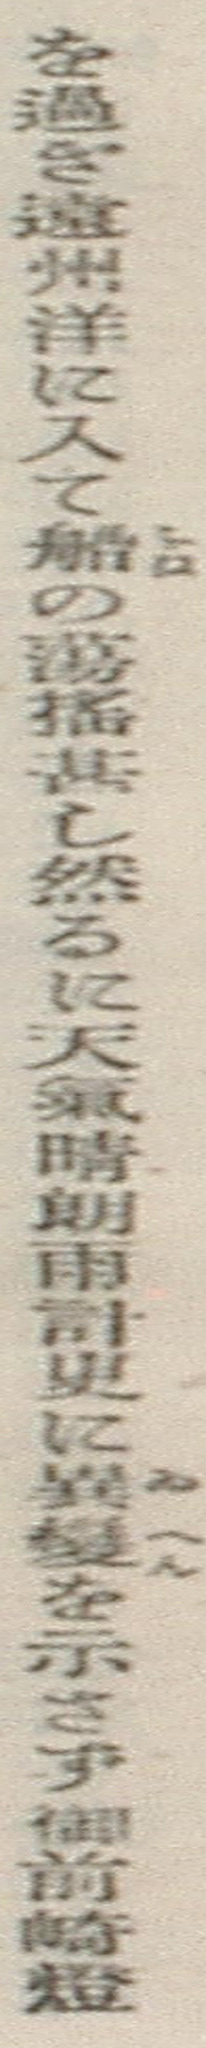を過遠州洋に入て船の蕩揺甚し然るに天気晴朗雨計更に異変を示さず御前崎燈
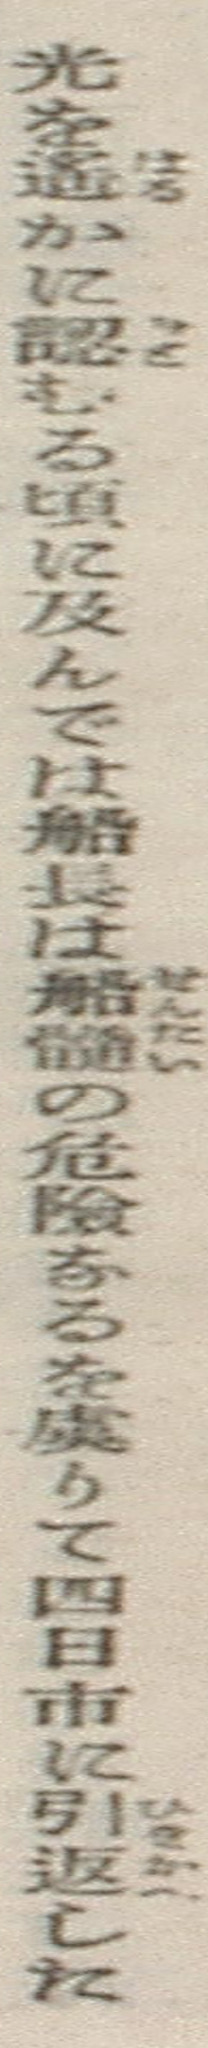光を遥かに認むる頃に及んでは船長は船体の危険なるを虞りて四日市に引返した
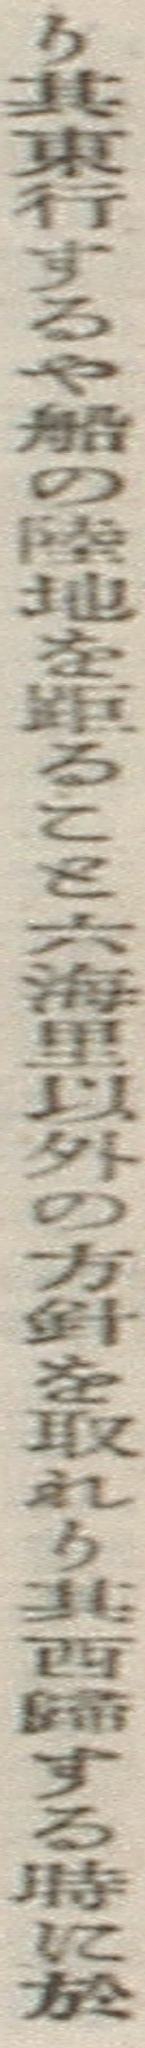り其東行するや船の陸地を距ること六海里以外の方針を取れり其西歸する時に於
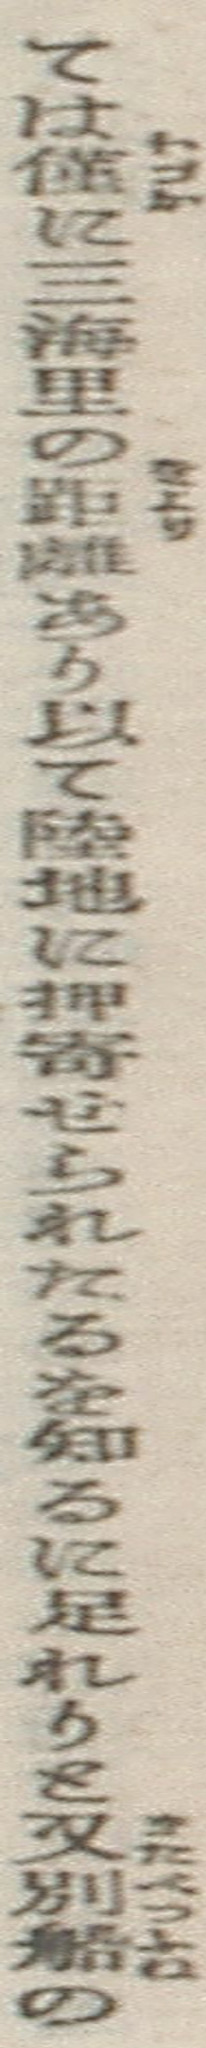ては僅に三海里の距離あり以て陸地に押寄せられたるを知るに足れりと又別船の
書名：愛知岐阜福井三県　大地震見聞録（内題）
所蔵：東京大学地震研究所図書室 Earthquake Research Institute Library, The University of Tokyo, JAPAN
